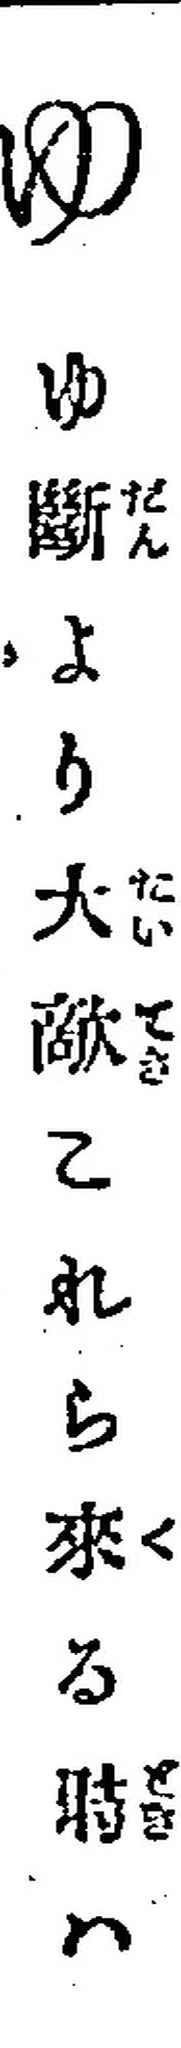ゆゆ断より大敵これら來る時は
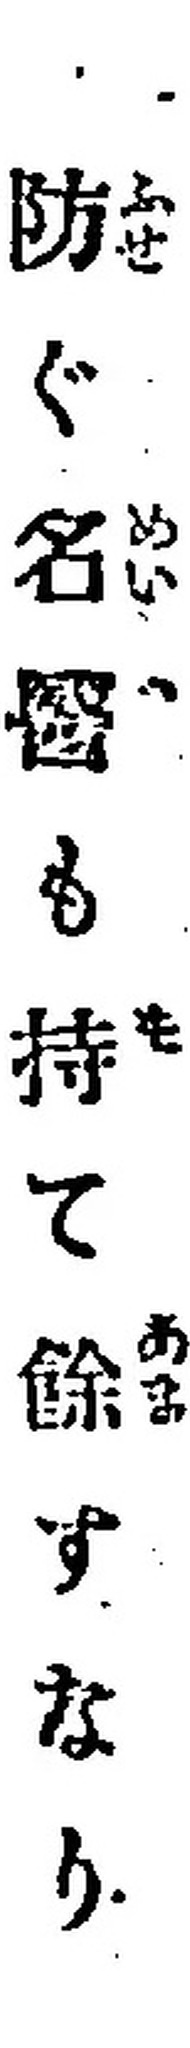防ぐ名醫も持て餘すなり
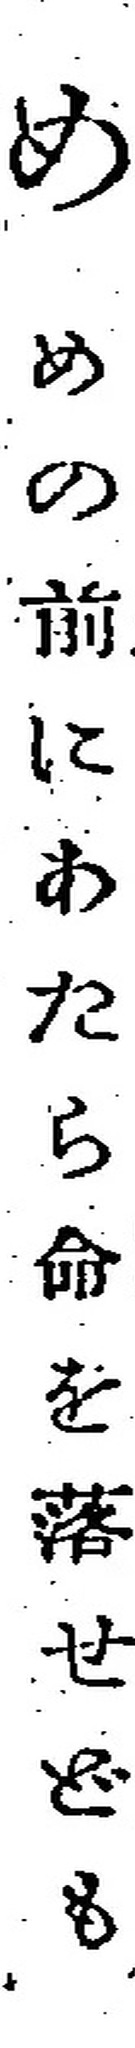めめの前にあたら命を落せども
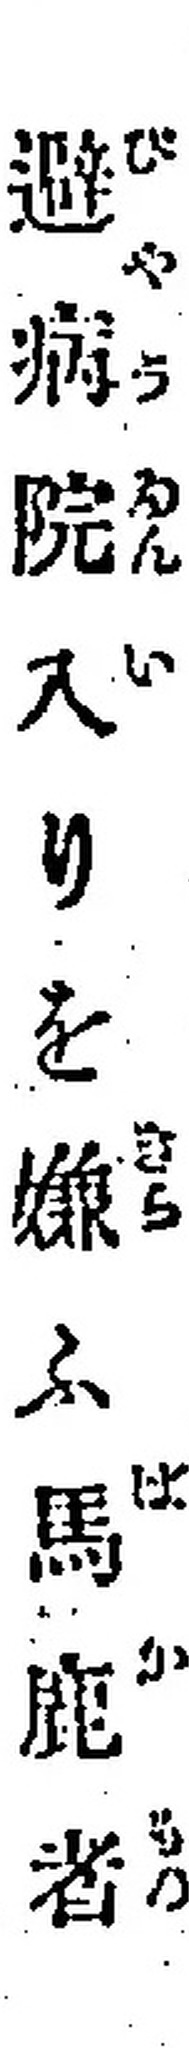避病院入りを嫌ふ馬鹿者
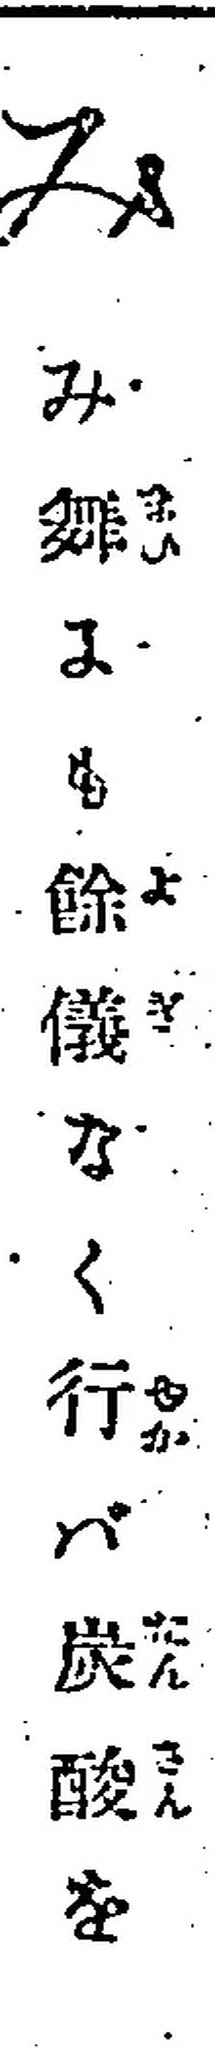みみ舞にも餘儀なく行ば炭酸を
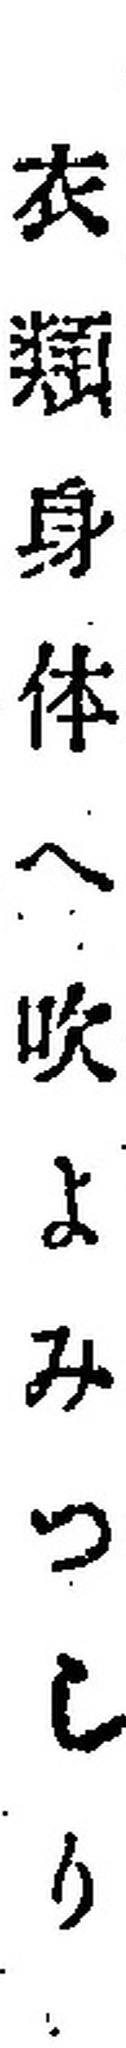衣類身体へ吹よみつしり
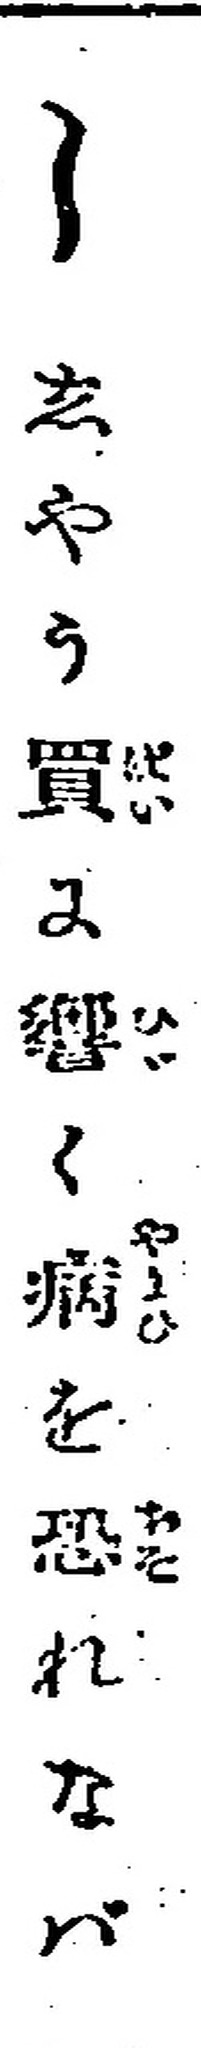ししやう買に響く病を恐れなば
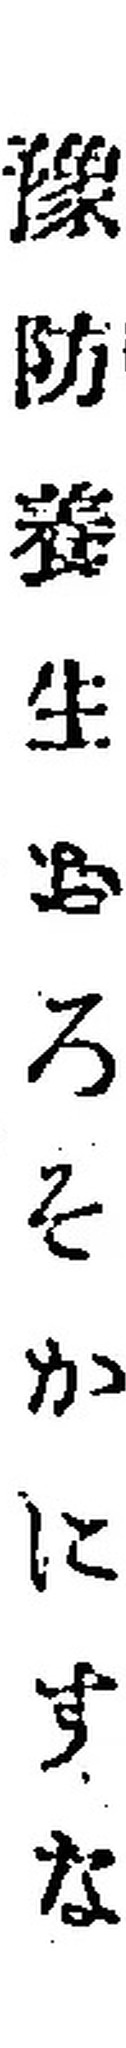豫防養生おろそかにすな
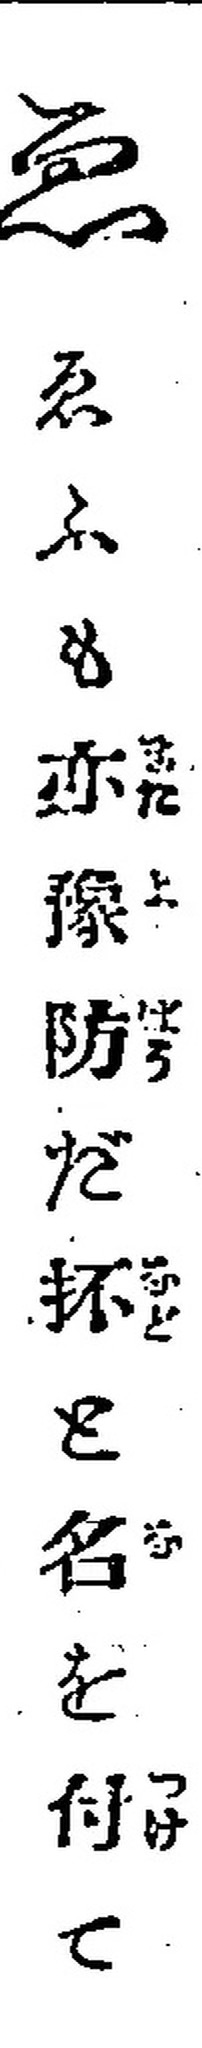ゑゑふも亦豫防だ抔と名を付て
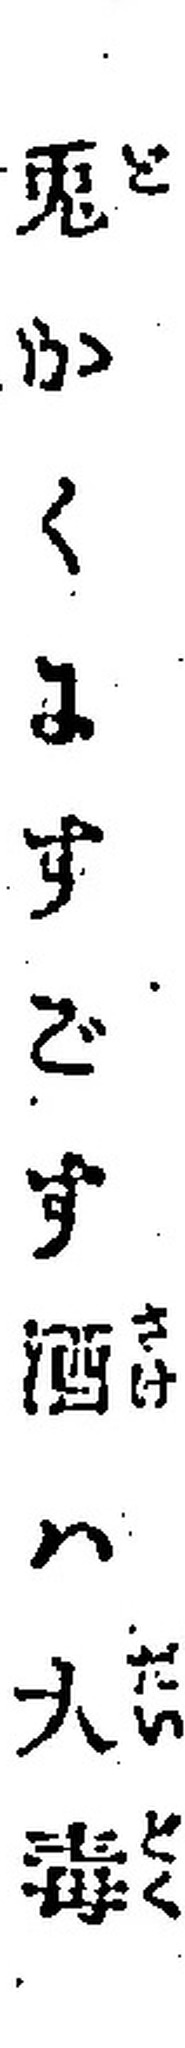兎かくにすごす酒は大毒
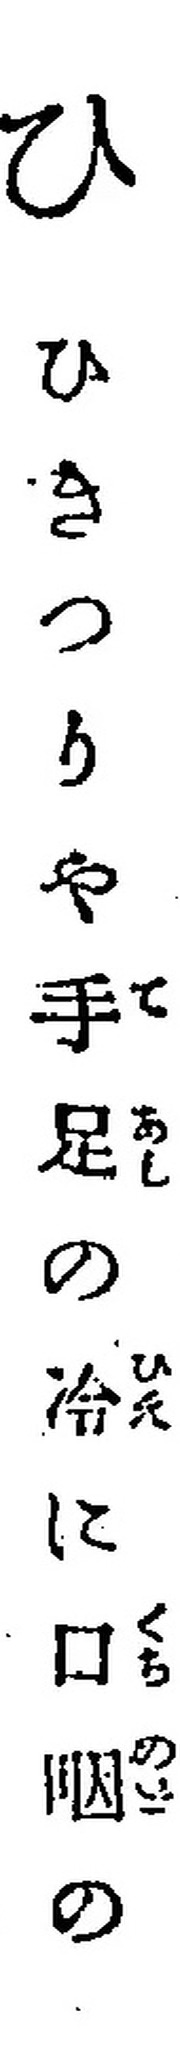ひひきつりや手足の冷に口咽の
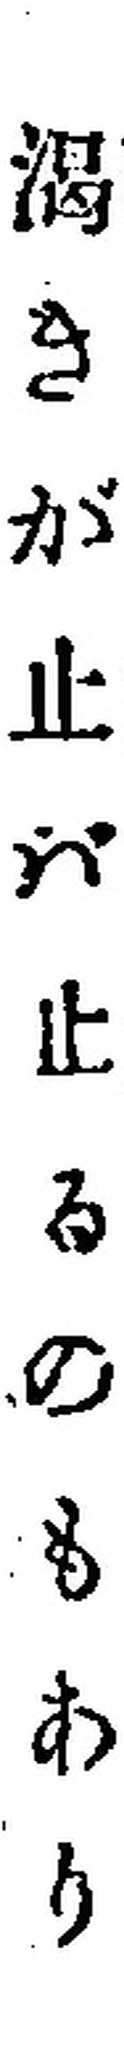渇きが止ば止るのもあり

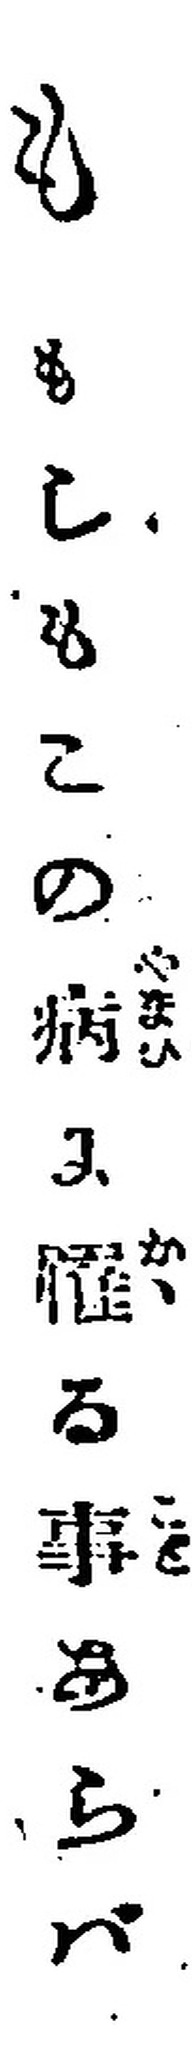ももしもこの病に罹る事あらば
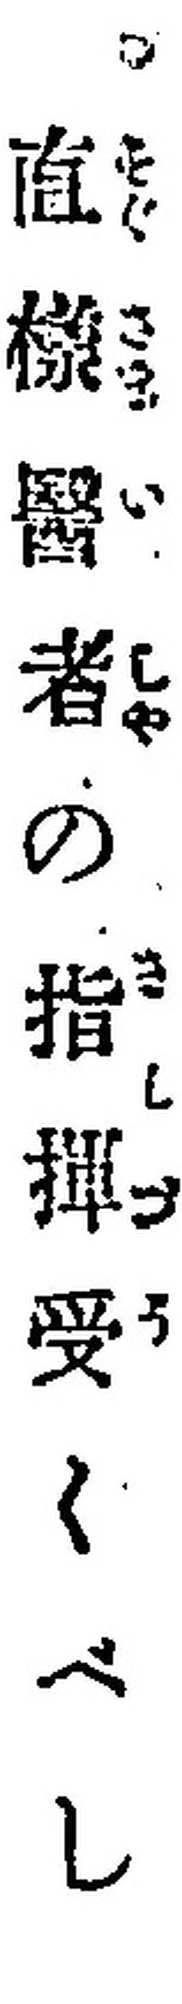直様醫者の指揮受くべし
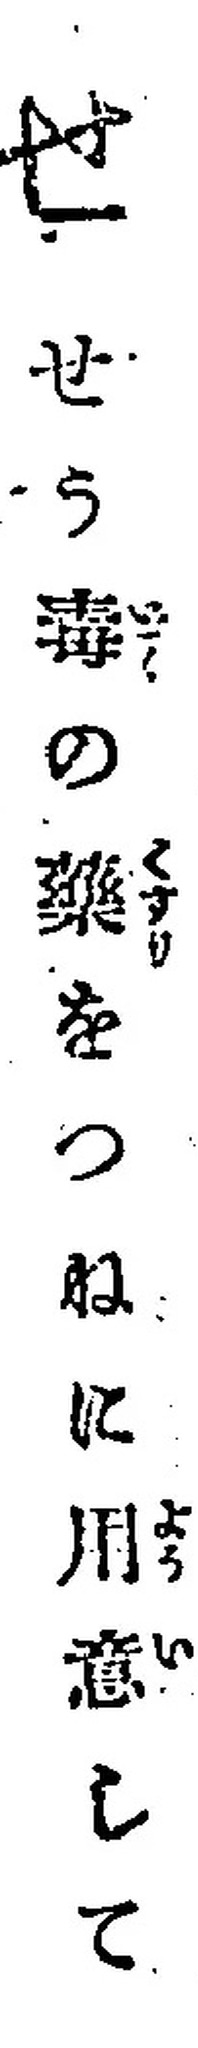せせう毒の藥をつねに用意して
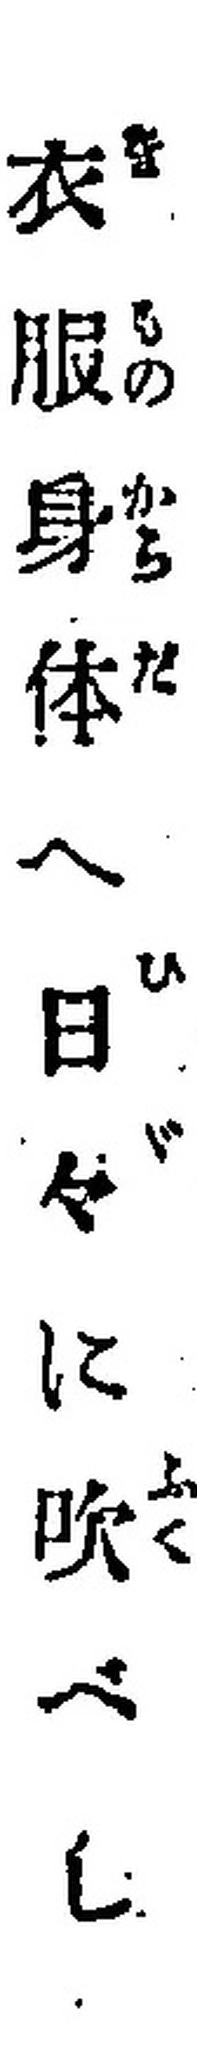衣服身体へ日々に吹べし
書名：新撰暑中養生法 : 附・コレラ予防歌
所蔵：国立国会図書館 National Diet Library, JAPAN
